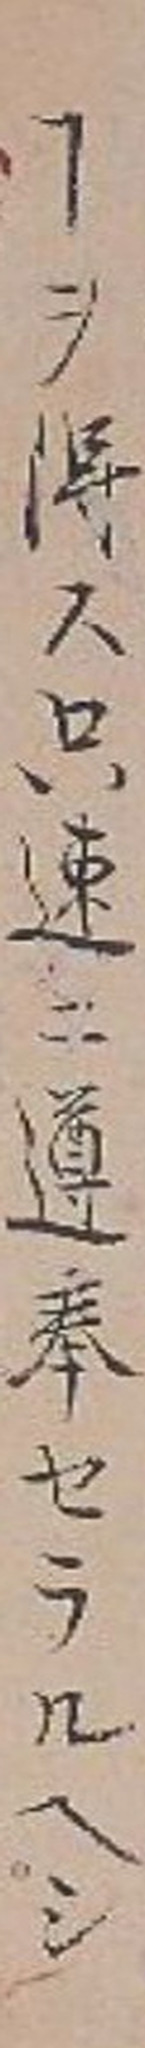コトヲ得ス只速ニ遵奉セラルヘシ
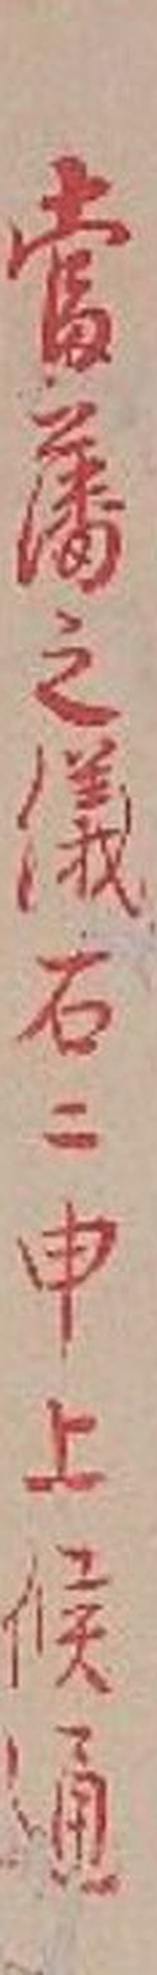一、当藩之儀右ニ申上候通
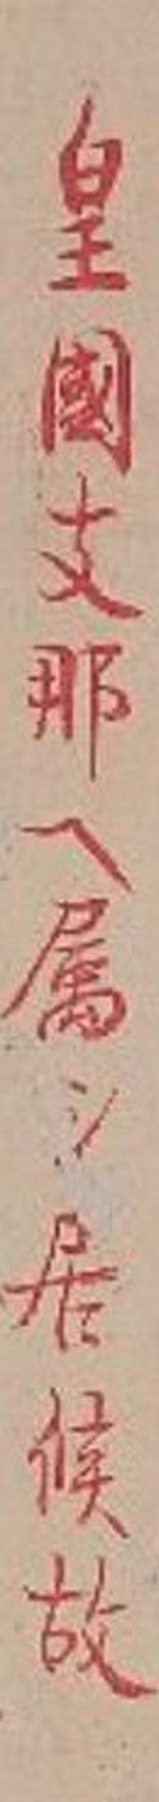皇国支那ヘ属シ居候故
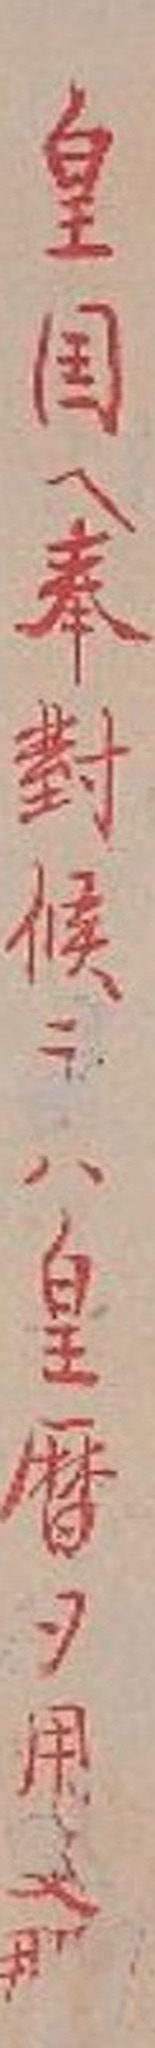皇国ヘ奉対候テハ皇暦ヲ用支那
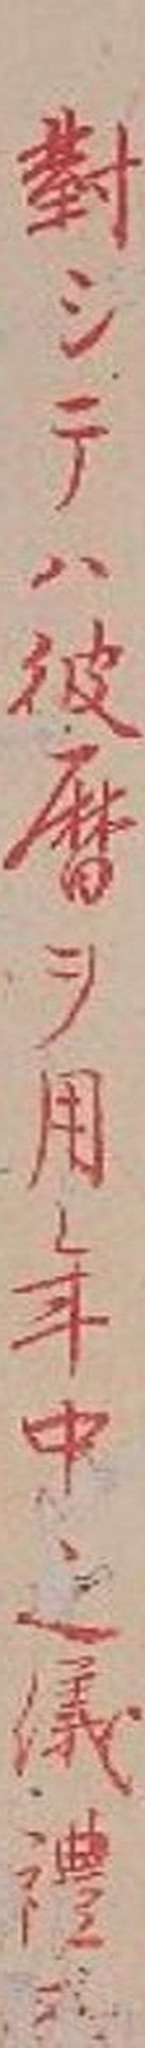対シテハ彼暦ヲ用年中之儀礼
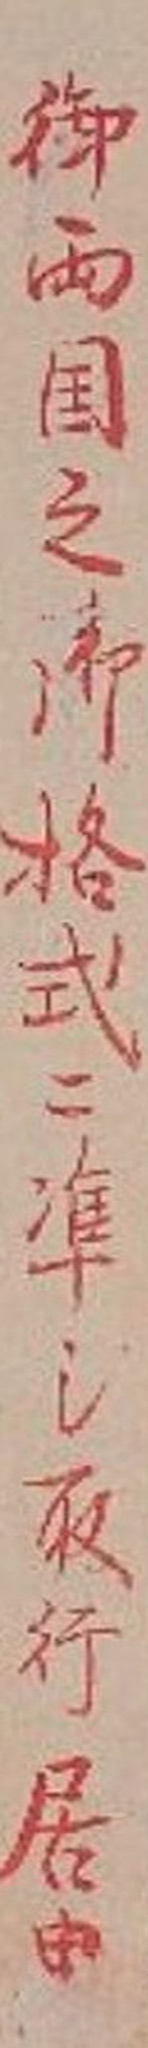御両国之御格式ニ準シ取行居申
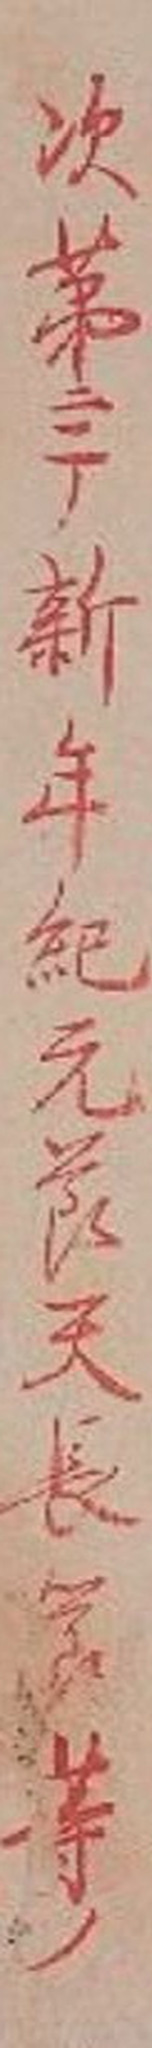次第ニテ新年紀元節天長節等ノ
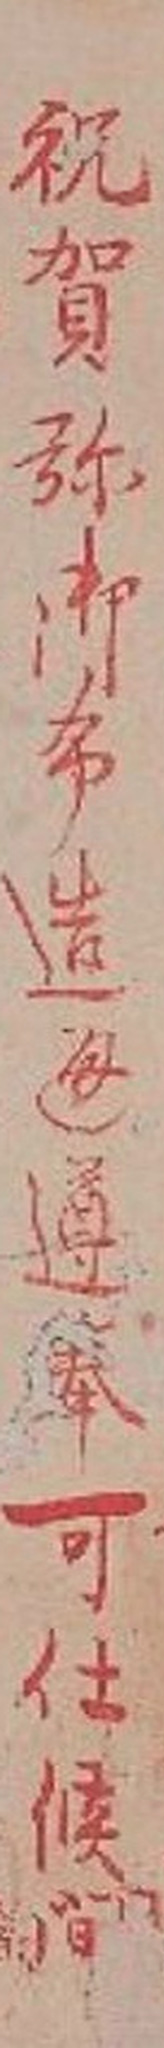祝賀弥御希造通遵奉可仕候間
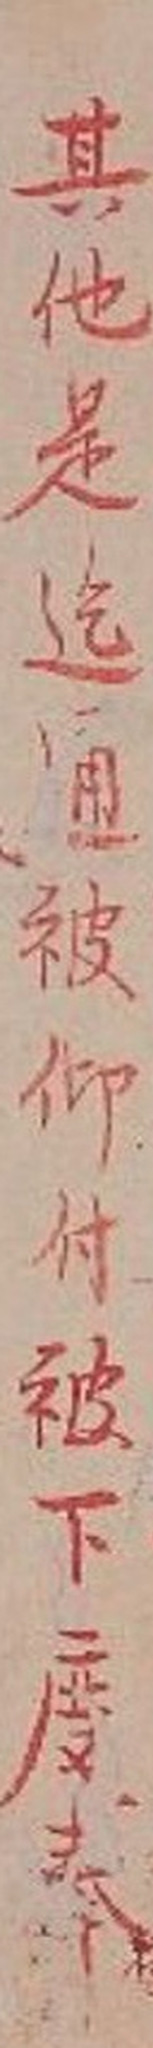其他是迄通」被仰付被下度奉
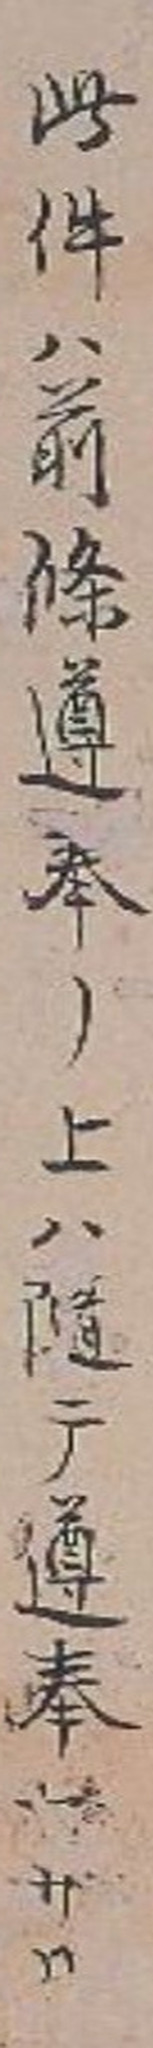此件ハ前条遵奉ノ上ハ随テ遵奉セサル
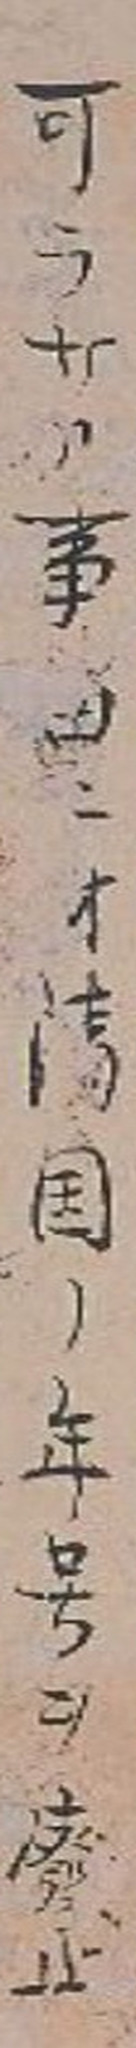可ラサル事清国ノ年号ヲ廃止

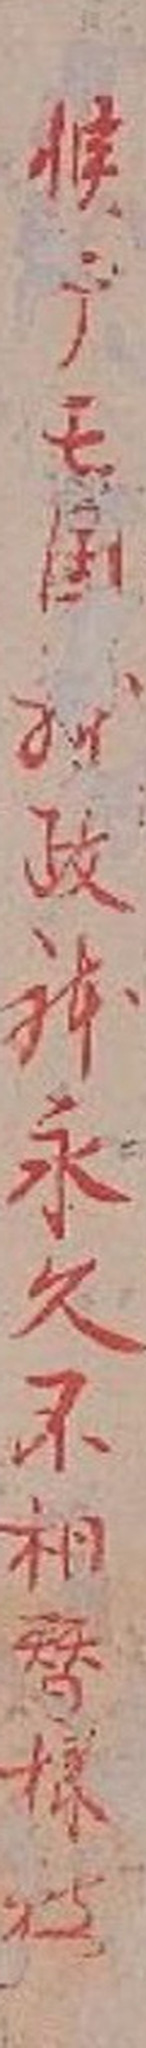候テモ国体政体永久不相替様被
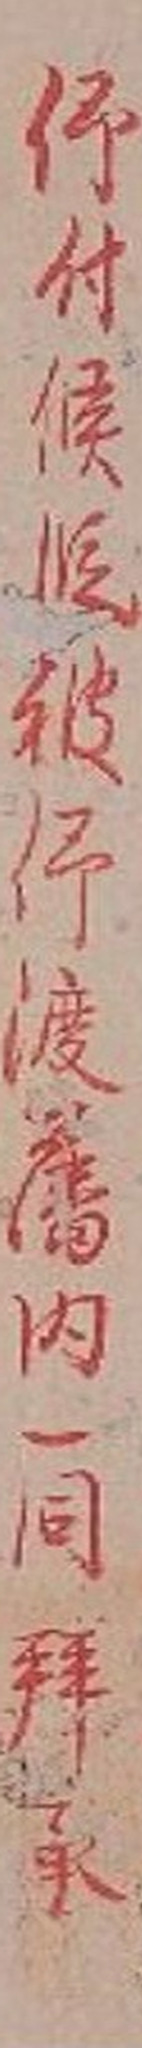仰付候段被仰渡藩内一同拝承
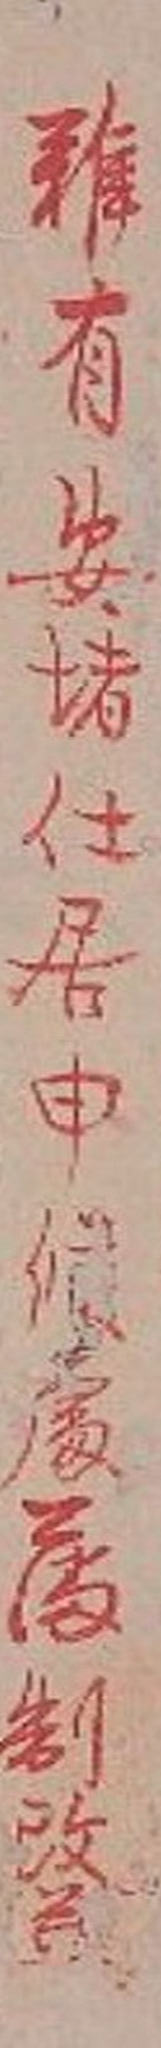難有安堵仕居申候処藩制改革
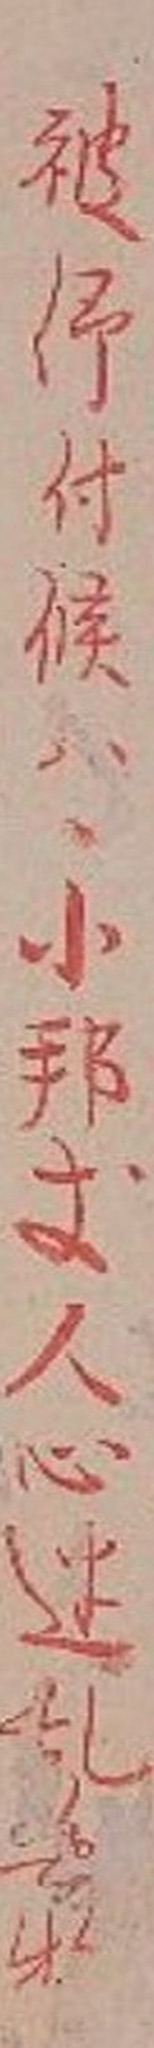被仰付候ハヽ小邦丈人心迷乱無
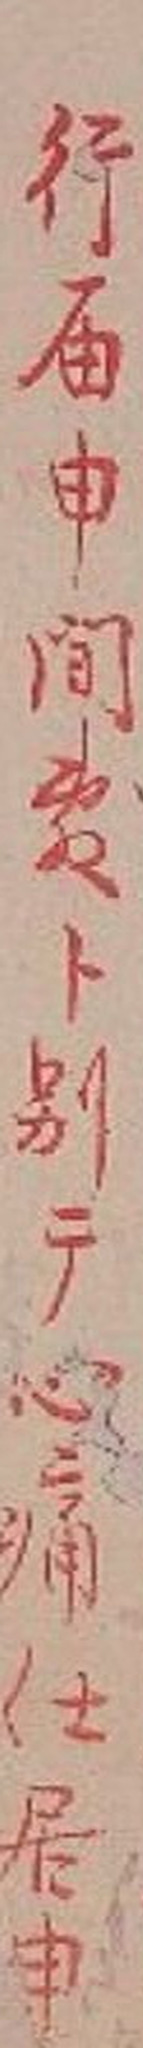行届申間敷ト別テ心痛仕居申
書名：奉使琉球始末 草稿之一部
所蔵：University of the Ryukyus Library
